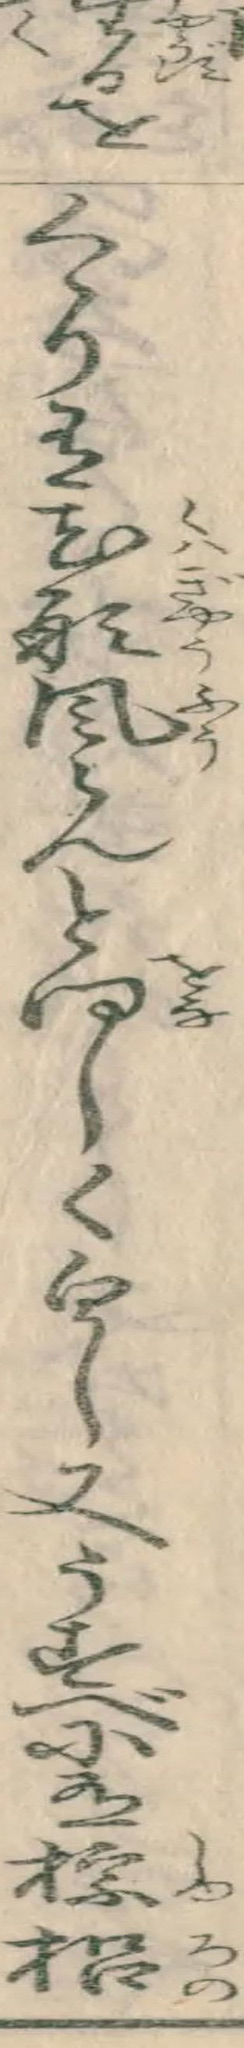くゝり有花形風らんと同しく白し又うすべに有棕梠
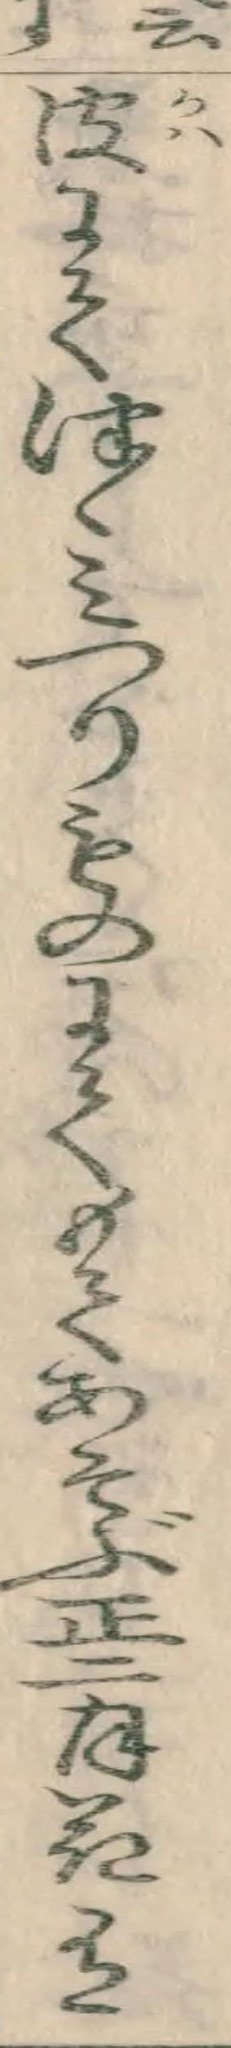皮にてつゝみつりものにてもてあそぶ正二月花有
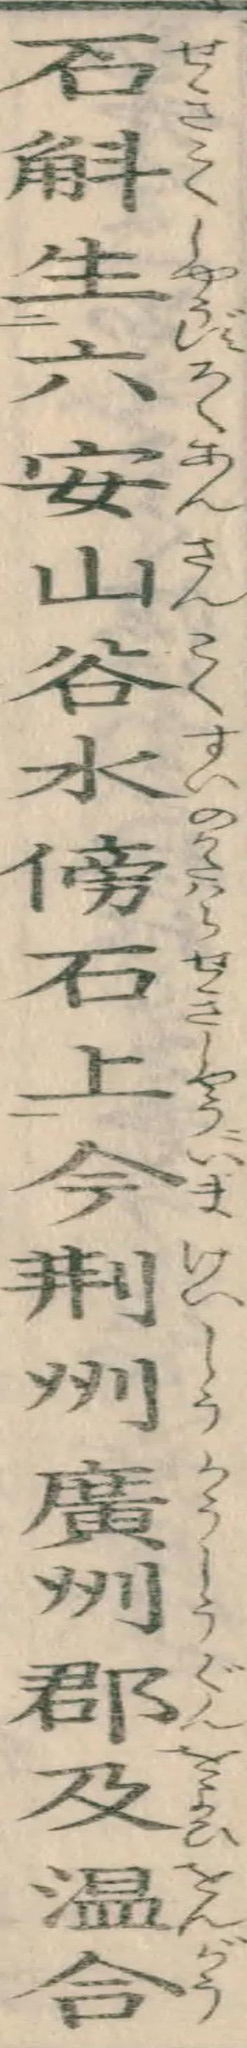石斛生六安山谷水傍石上今荊州広州郡及温合
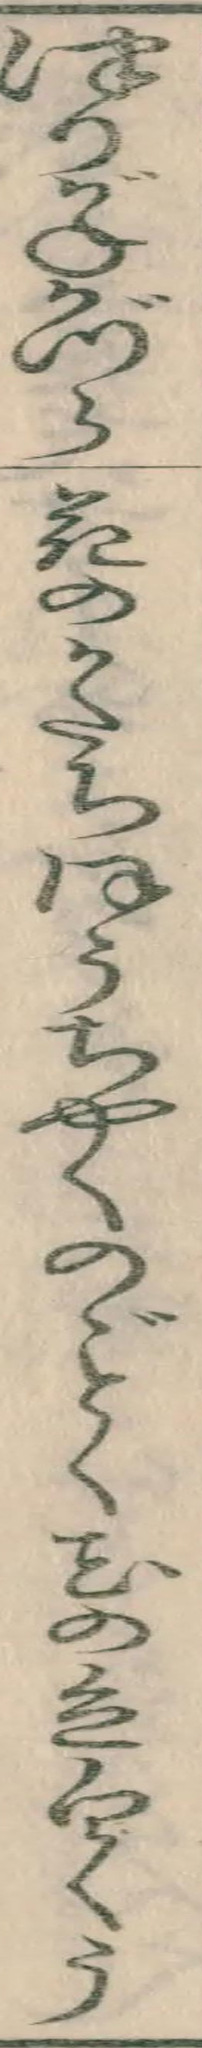[つりがねかづら]花のかたちほうちやくのごとく花の色白くう
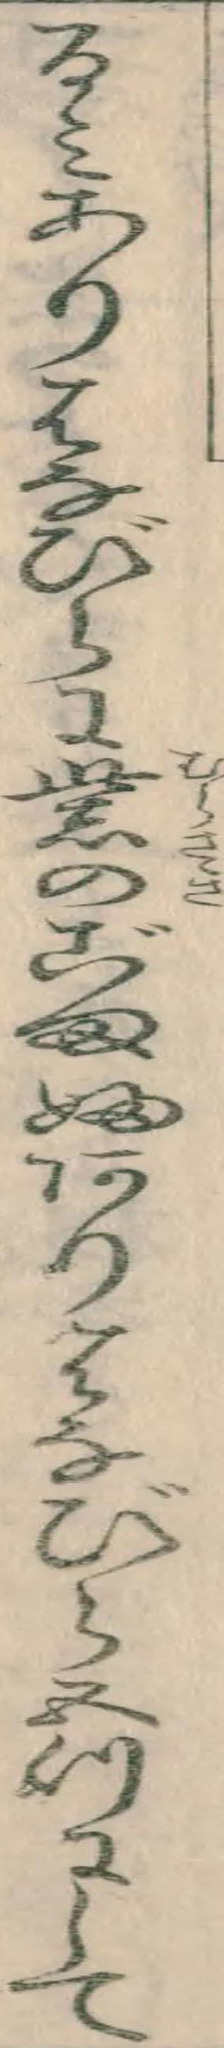るみありはなびらに紫のごまふありはなびら五つにして
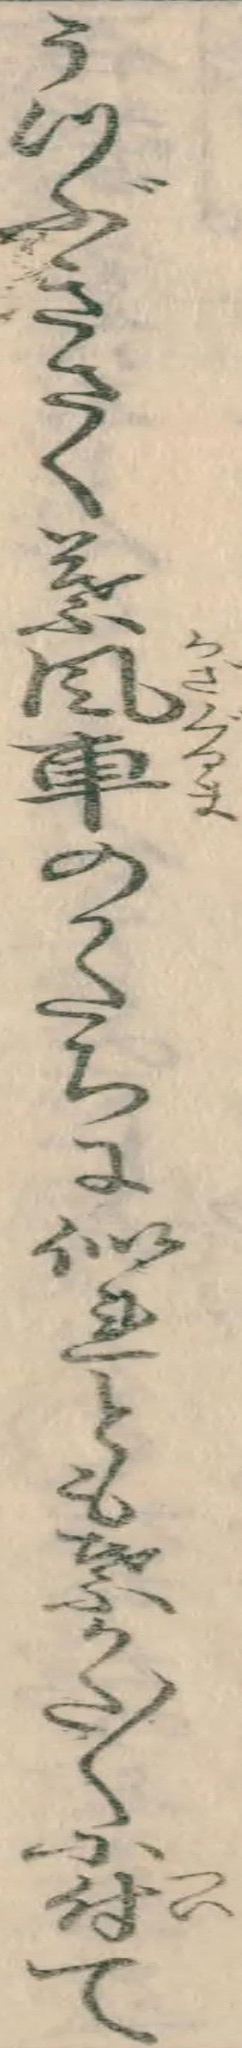うつぶきさく葉風車のかたちに似れとも葉かた〳〵に付て
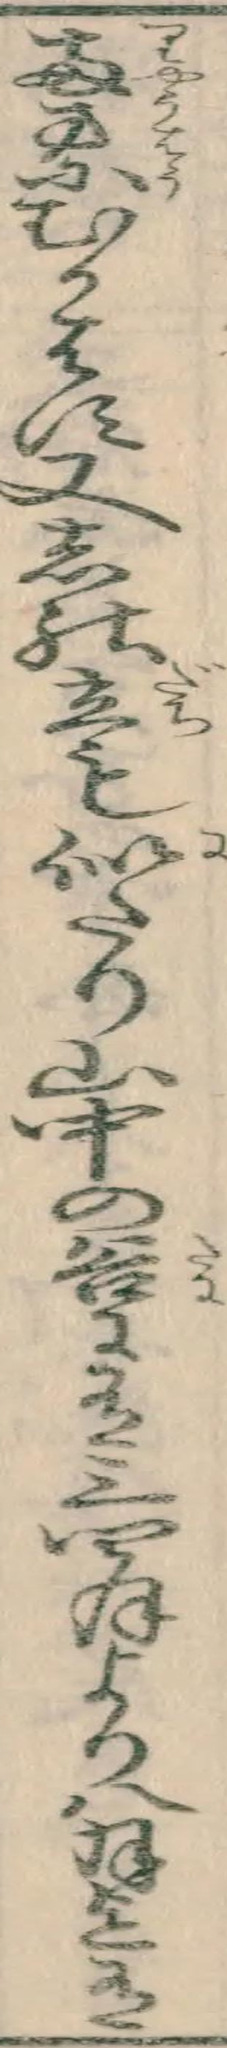両方にむかはす又しの立も似たり山中の谷に有三四月より八月迄有
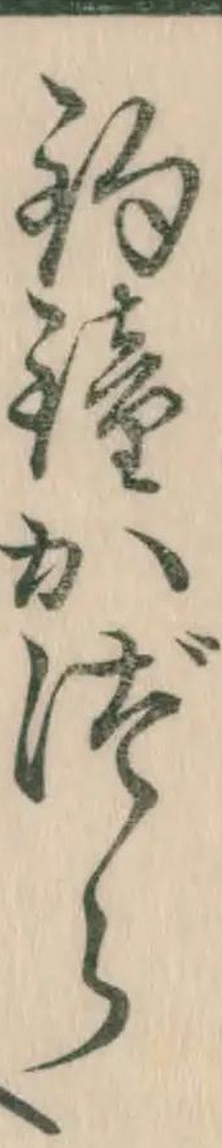釣鐘かづら

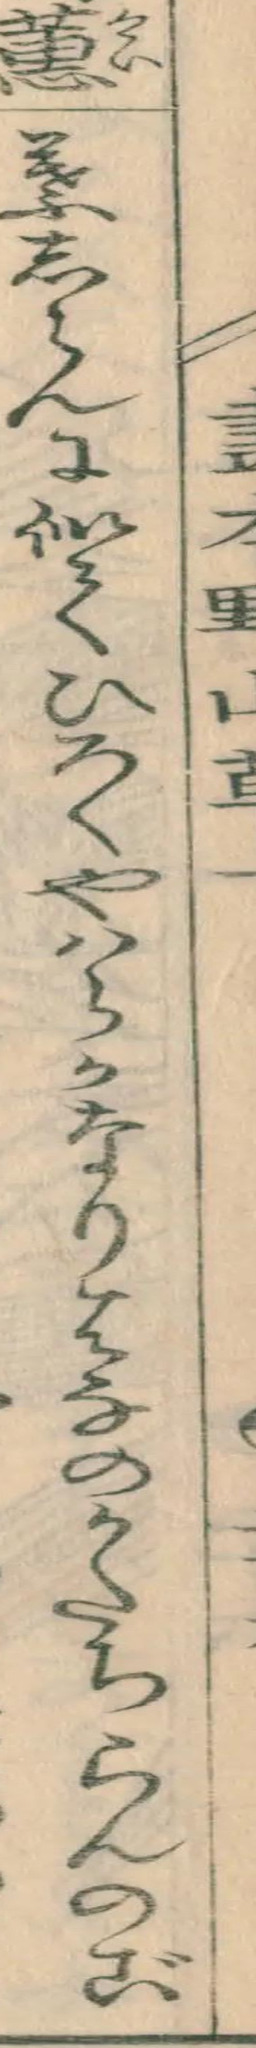[黄蕙]葉しらんに似てひろくやはらかなりはなのかたちらんのご
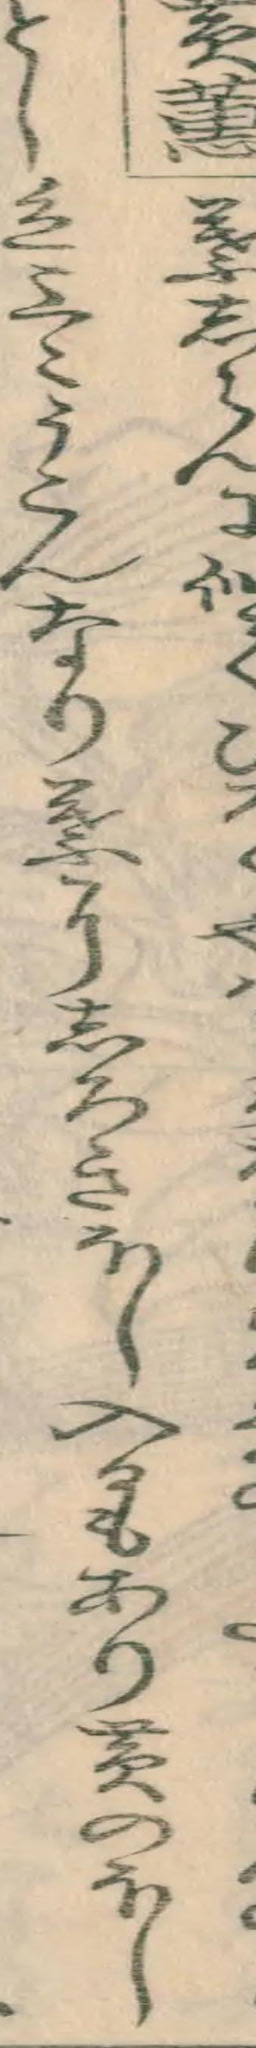とし色上々うこんなり葉にしろきほし入るもあり黄のほし
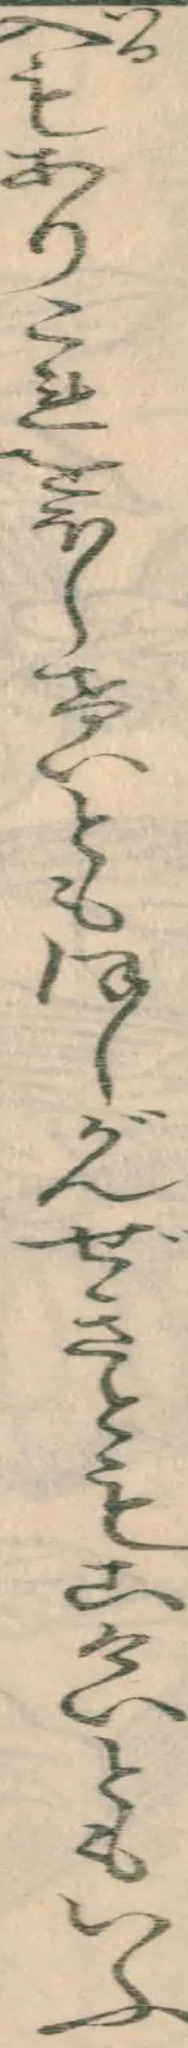入もありこれをほしけいともほしがんぜきともこけいともいふ
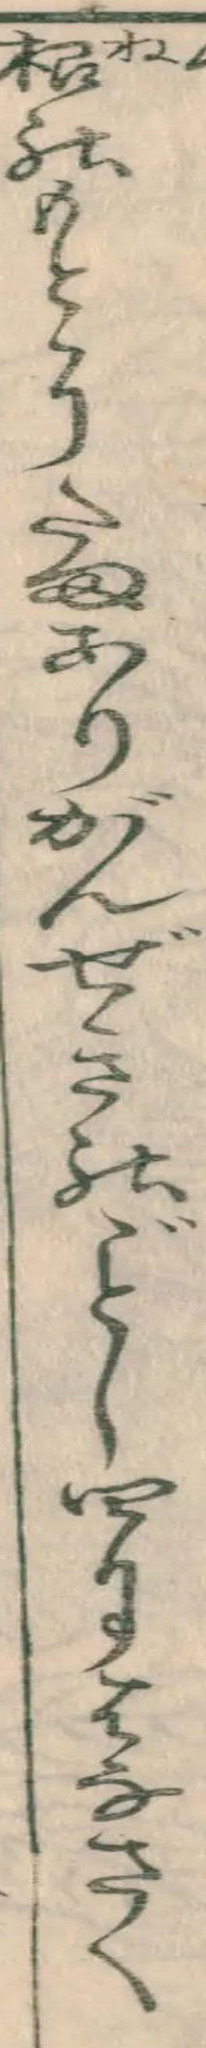根のもとにたまありがんぜきのごとし四月はなさく
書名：畫本野山草. [1]
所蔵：国立国会図書館 National Diet Library, JAPAN
